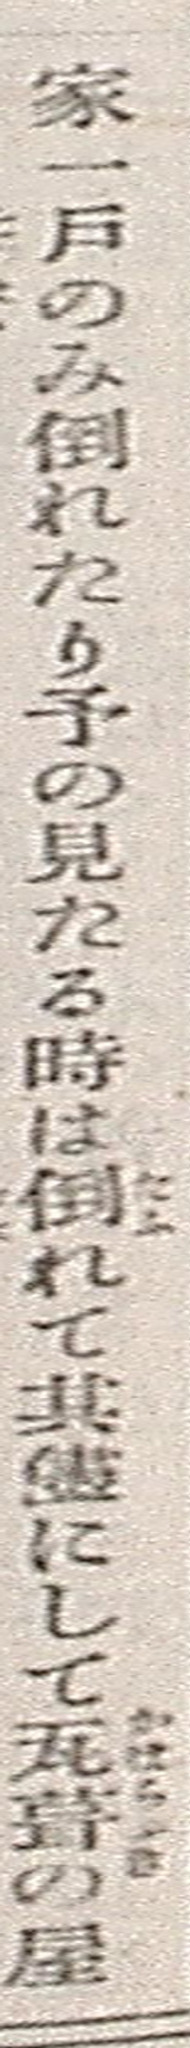家一戸のみ倒れたり予の見たる時は倒れて其儘にして瓦葺の屋
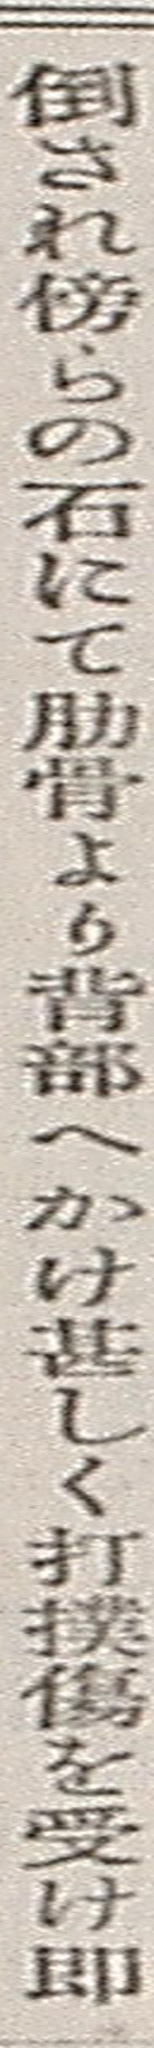倒され傍らの石にて肋骨より背部へかけ甚しく打撲傷を受け即
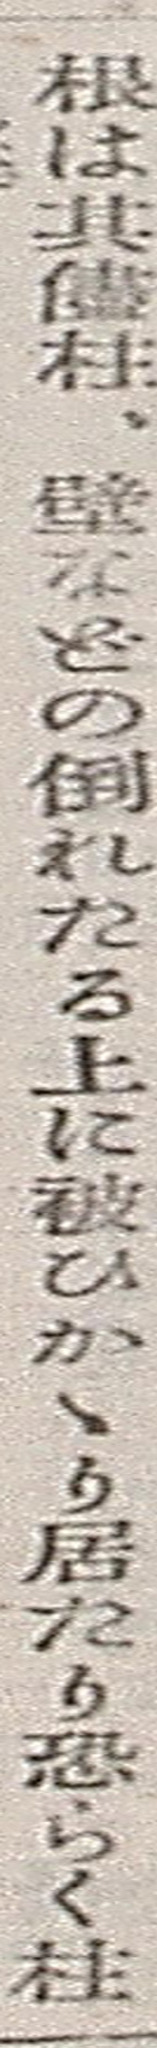根は其儘柱、壁などの倒れたる上に被ひかゝり居たり恐らく柱
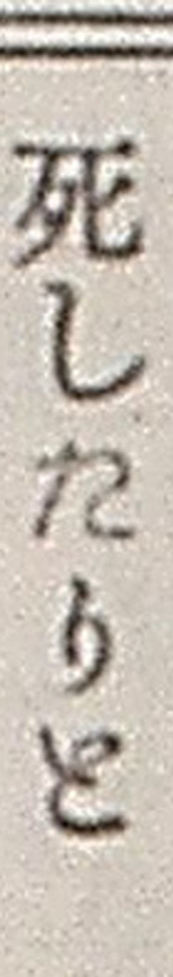死したりと
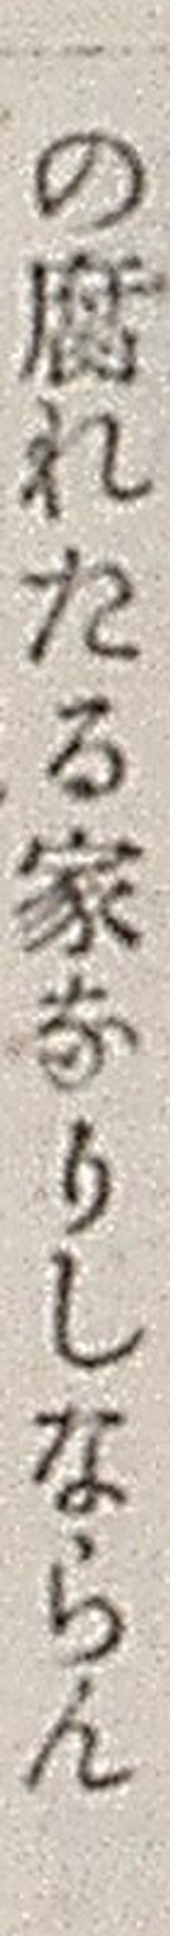の腐れたる家なりしならん
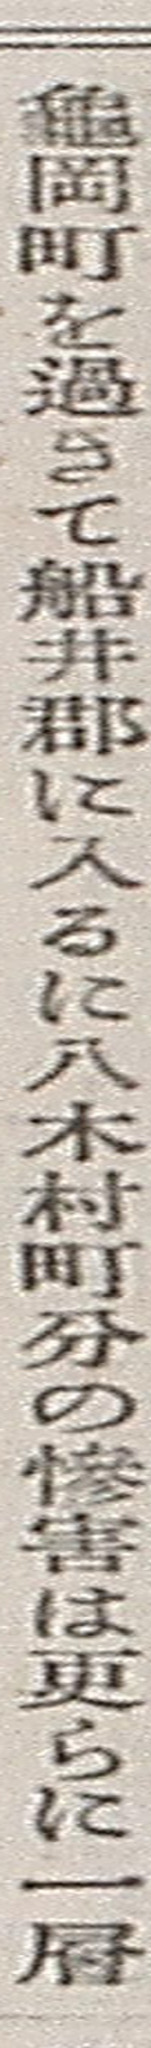亀岡町を過ぎて船井郡に入るに八木村町分の惨害は更らに一層
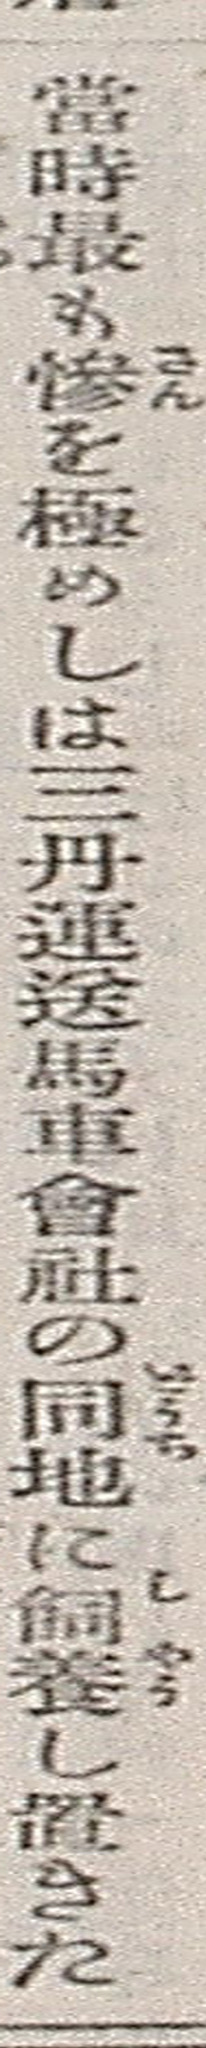当時最も惨を極めしは三丹運送馬車會社の同地に飼養し置きた
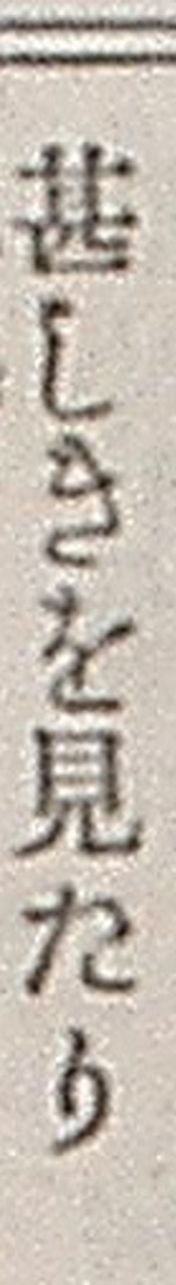甚しきを見たり
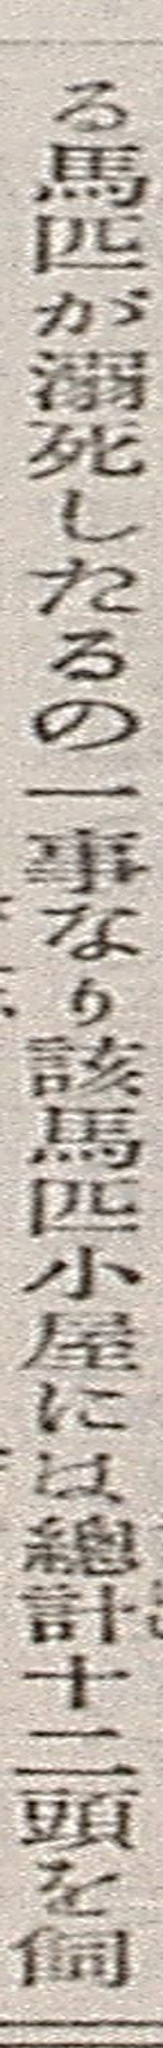る馬匹が溺死したるの一事なり該馬匹小屋には総計十二頭を飼
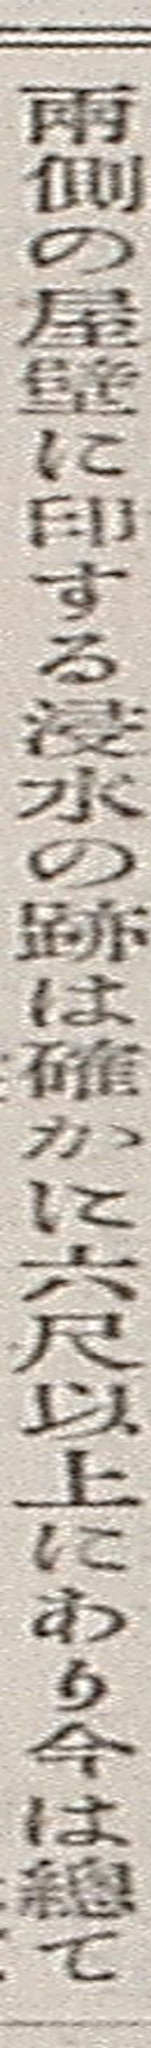両側の屋壁に印する浸水の跡は確かに六尺以上にあり今は総て
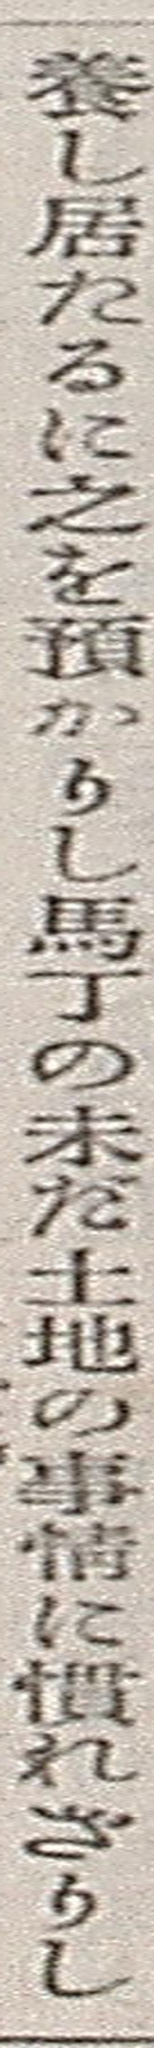養し居たるに之を預かりし馬丁の未だ土地の事情に慣れざりし
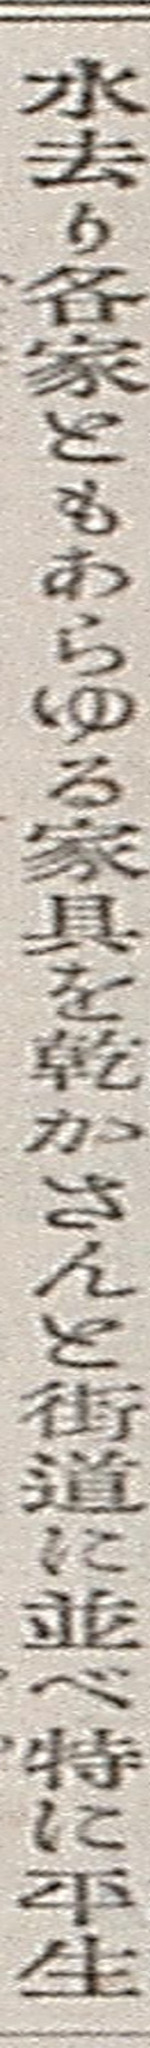水去り各ともあらゆる家具を乾かさんと街道に並べ特に平生
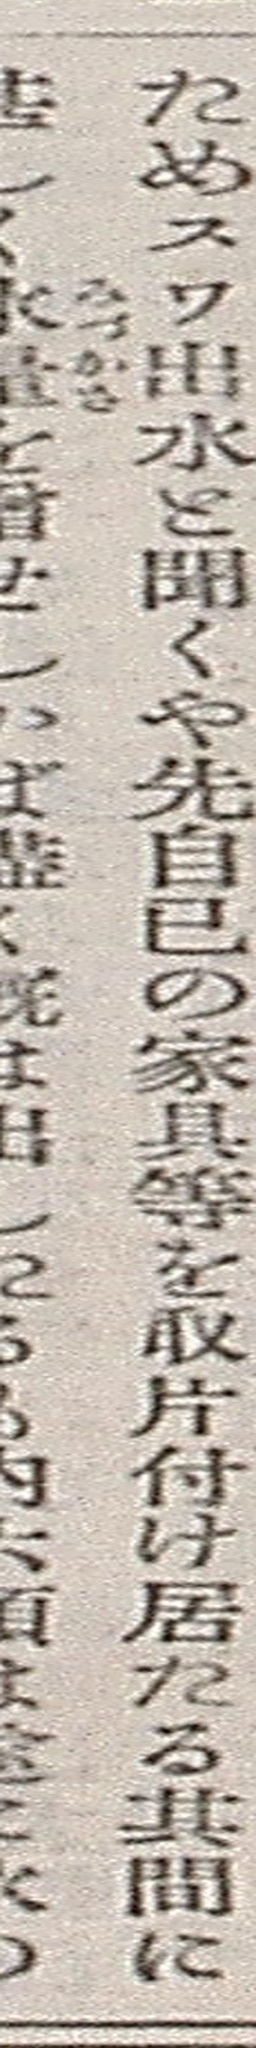甚しく水量を増せしかば盡く厩は出したるも内六頭は遂に水の
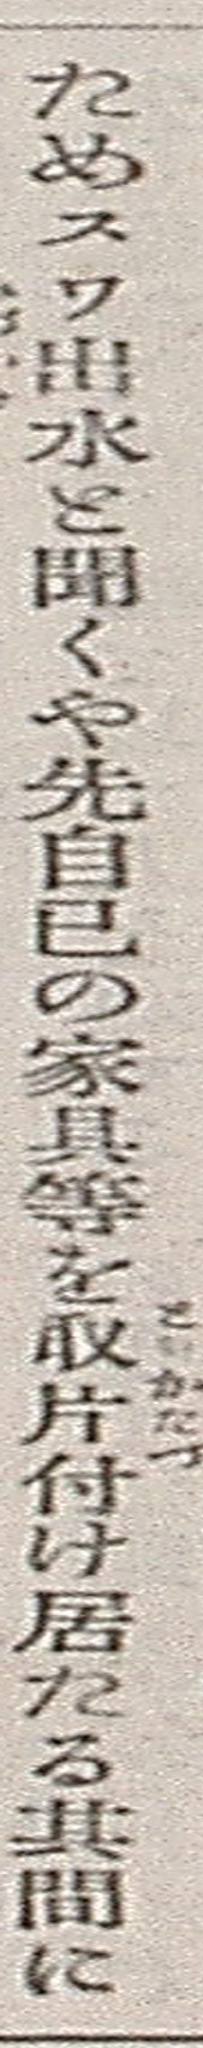ためスワ出水と聞くや先自己の家具等を取片付け居たる其間に
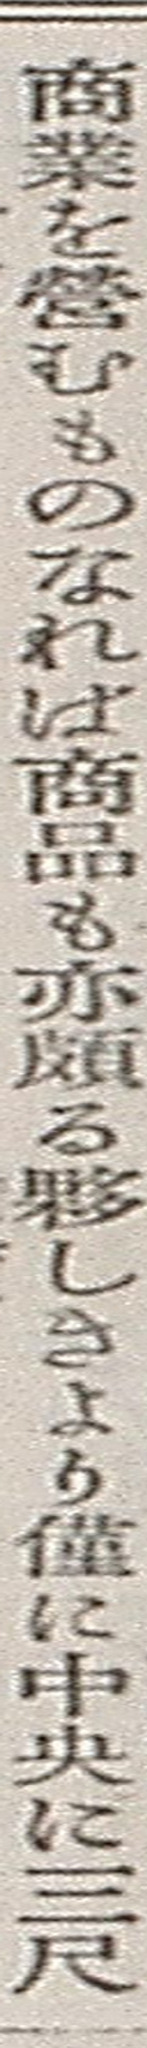商業を営むものなれば商品も亦頗る夥しきより僅に中央に三尺
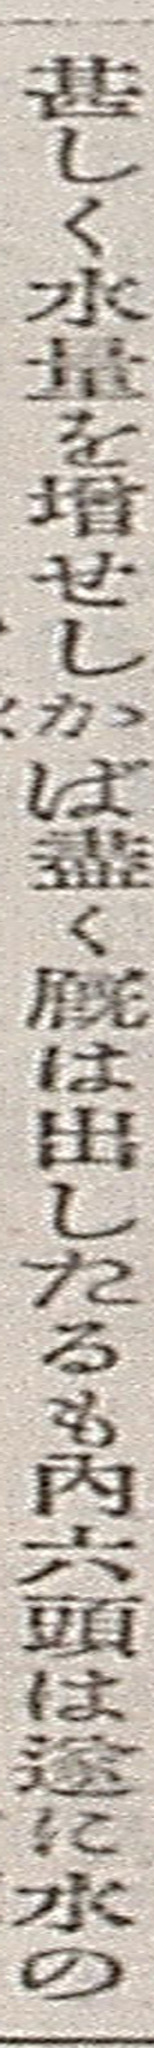甚しく水量を増せしかば盡く厩は出したるも内六頭は遂に水の
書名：風俗畫報臨時増刊第百二十六號　洪水被害録（中）
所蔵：東京大学地震研究所図書室 Earthquake Research Institute Library, The University of Tokyo, JAPAN
